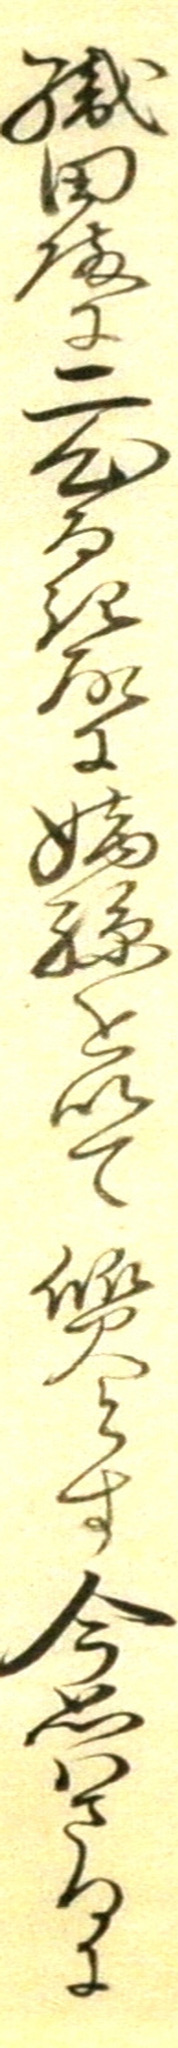織田殿に二心なき故に嫡孫を以て質とす今思はさるに
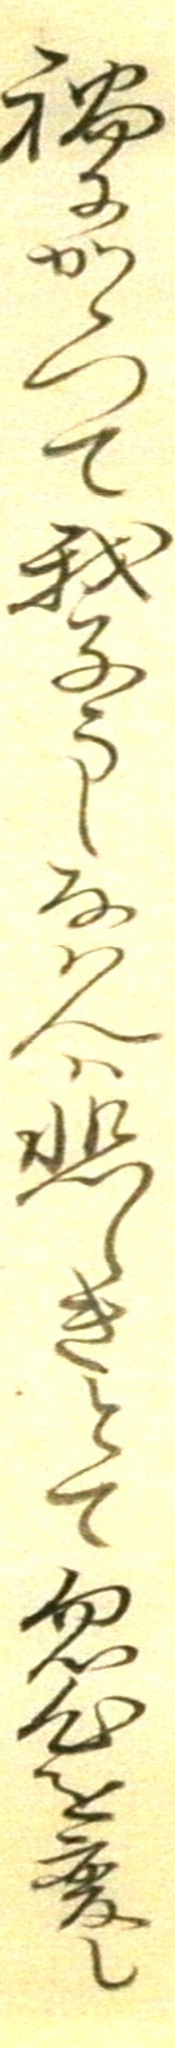禍にかゝつて我子うしなはんは悲しきとて忽心を変し
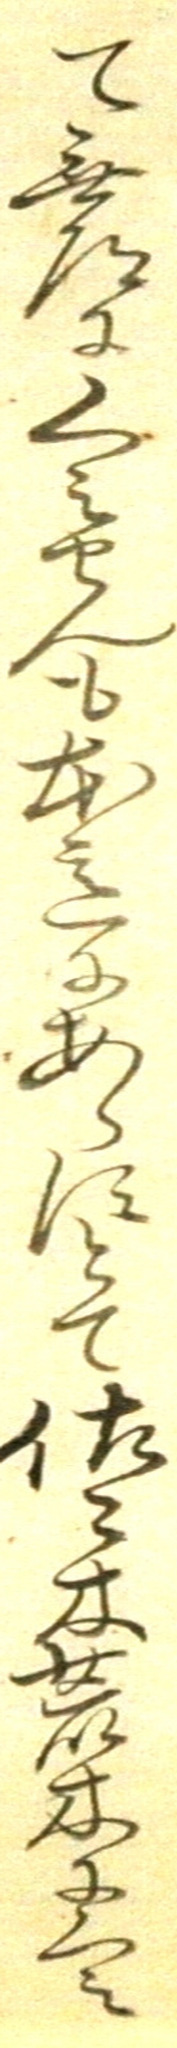て無道にくみせんも本意にあらすとて佐々木荒木にくみ
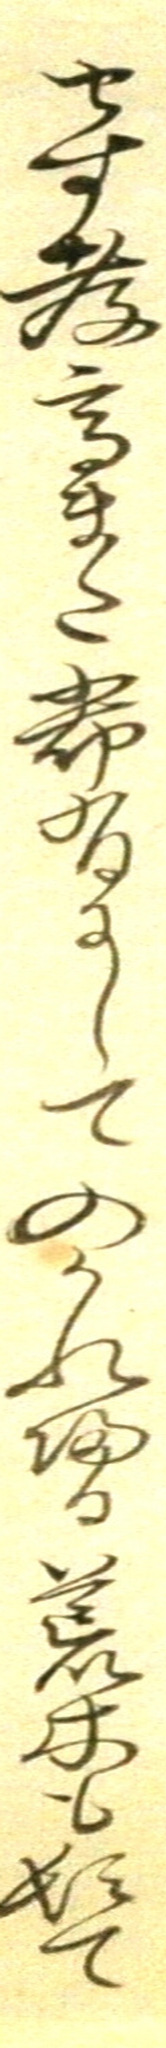せす孝高また希有にしてのかれ帰る荒木も頓て
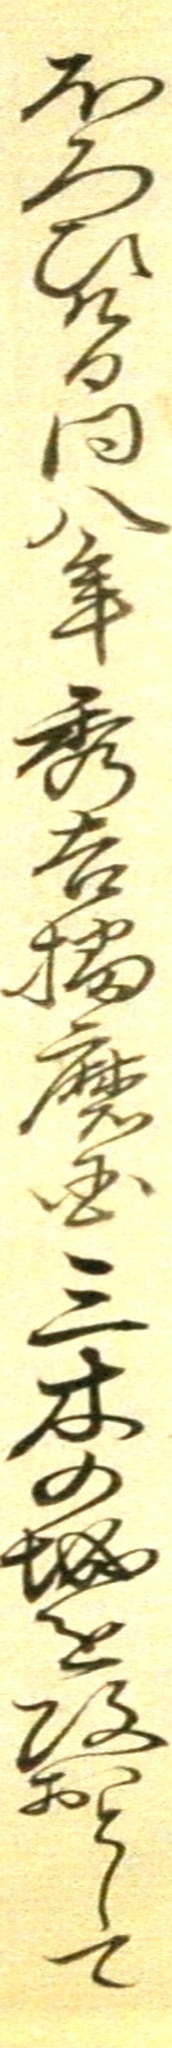ほろひける同八年秀吉播磨国三木の城を攻おとして
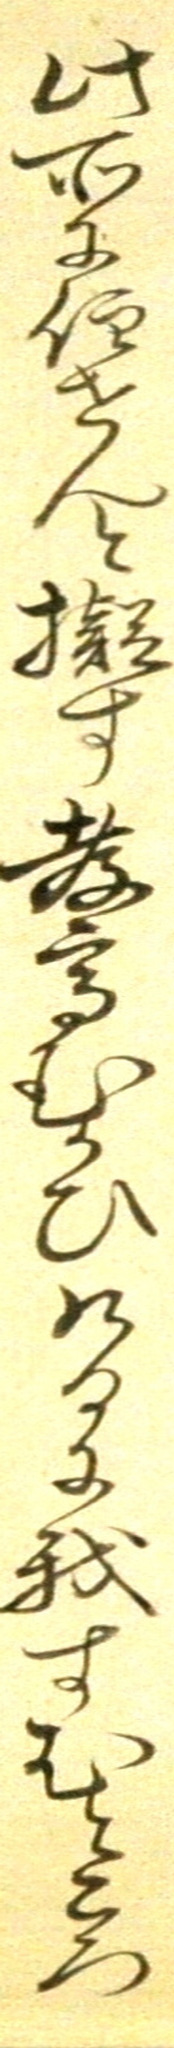此所に住せんと擬す孝高むかひけるに我すむところ
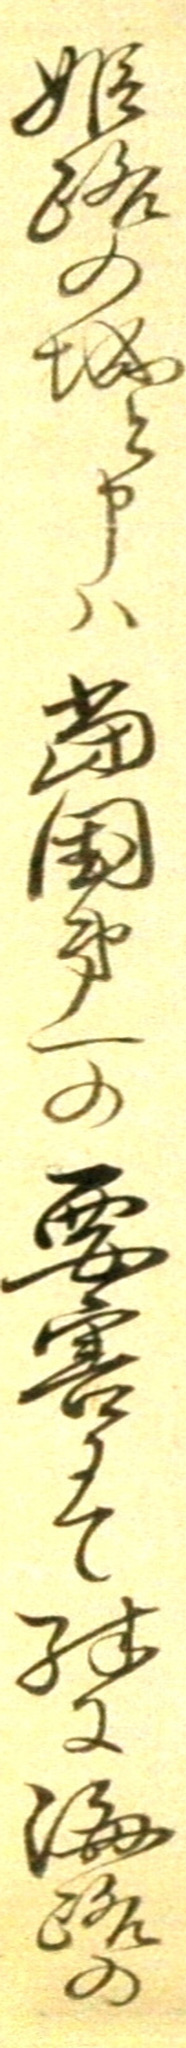姫路の城と申は当国第一の要害にて殊に海路の
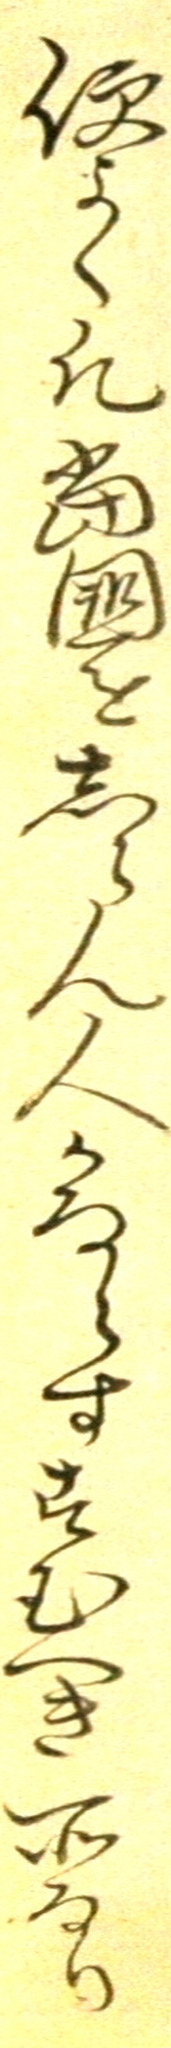便よく凡当国をしらん人かならすすむへき所なり

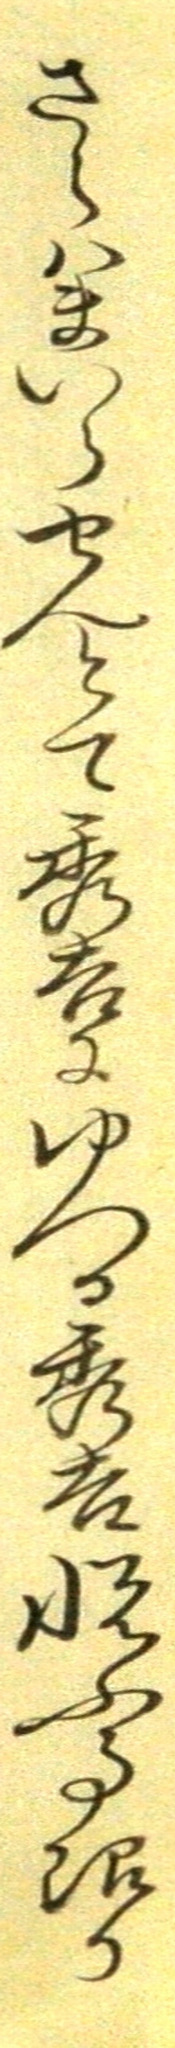さらはまいらせんとて秀吉にゆつる秀吉悦ふ事限り
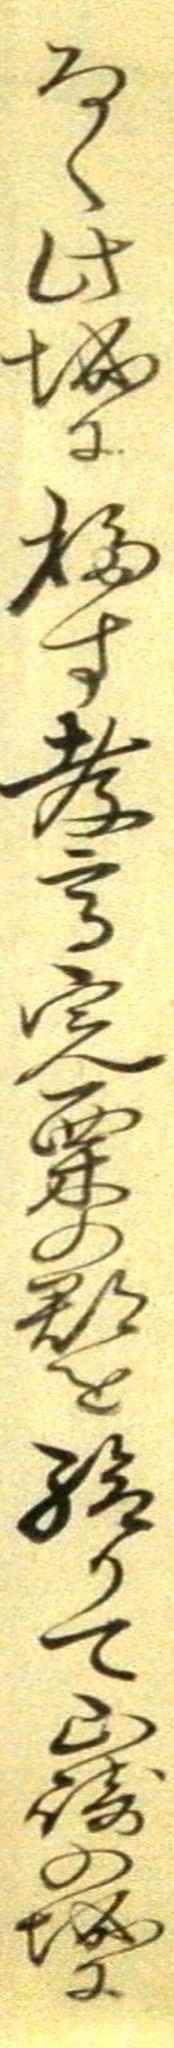なく此城に移す孝高宍粟の郡を給りて山崎の城に
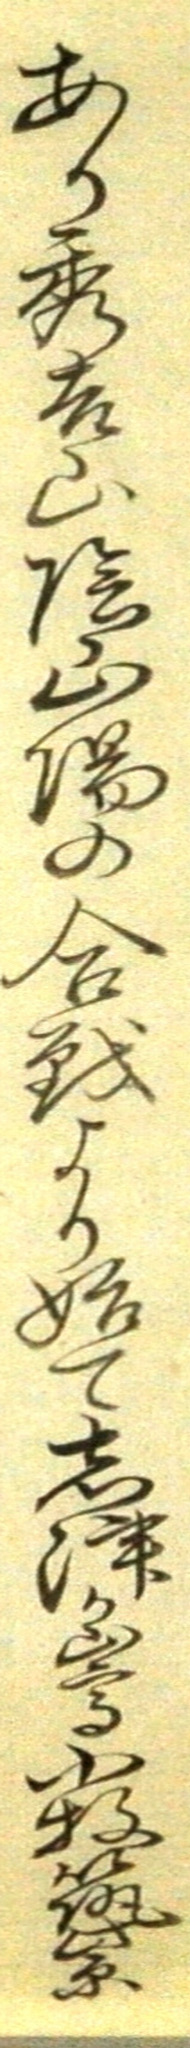あり秀吉山陰山陽の合戦より始て志津か嵩小牧筑紫
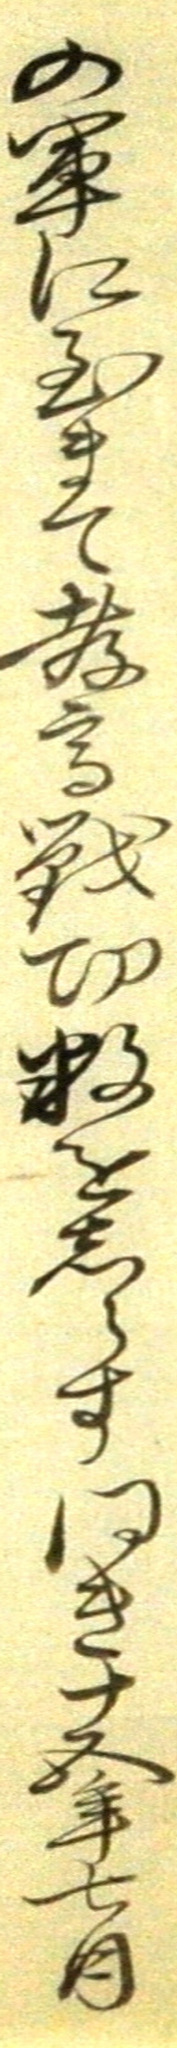の軍に至まて孝高戦功数をしらす同き十五年七月
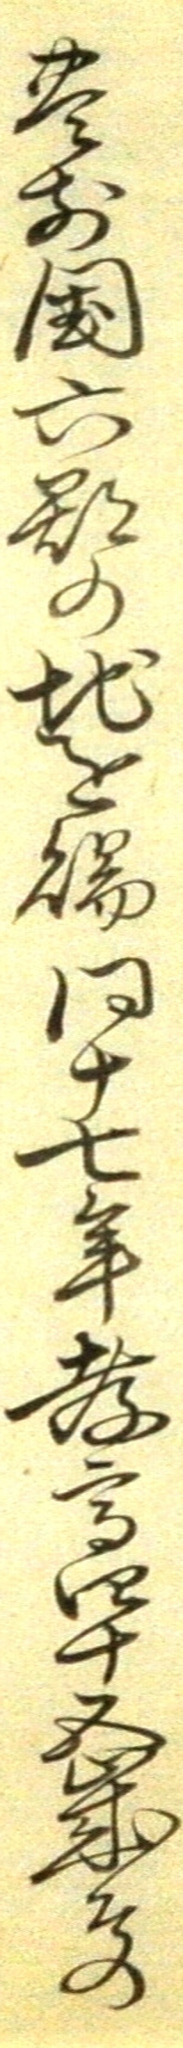豊前国六郡の地を賜同十七年孝高四十五歳その
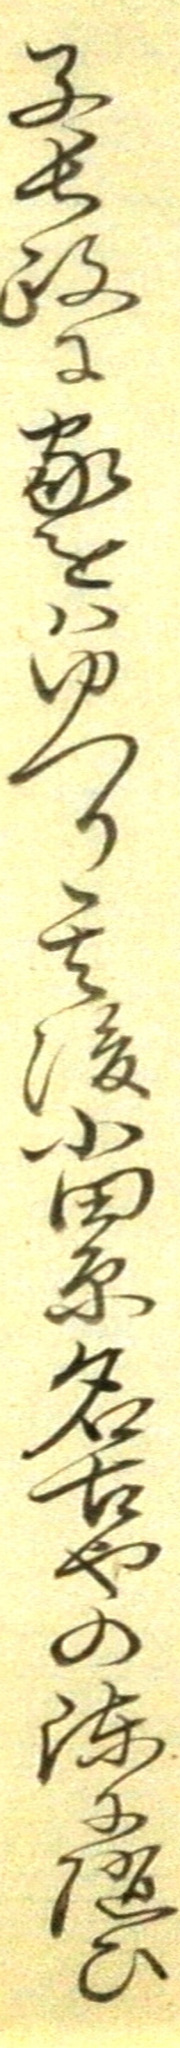子長政に家をはゆつり其後小田原名古やの陣に随ひ
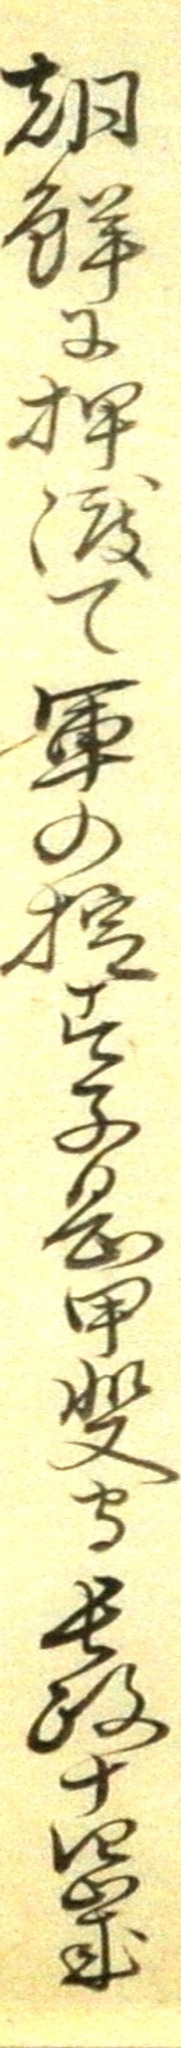朝鮮に押渡て軍の掟す子息甲斐守長政十四歳
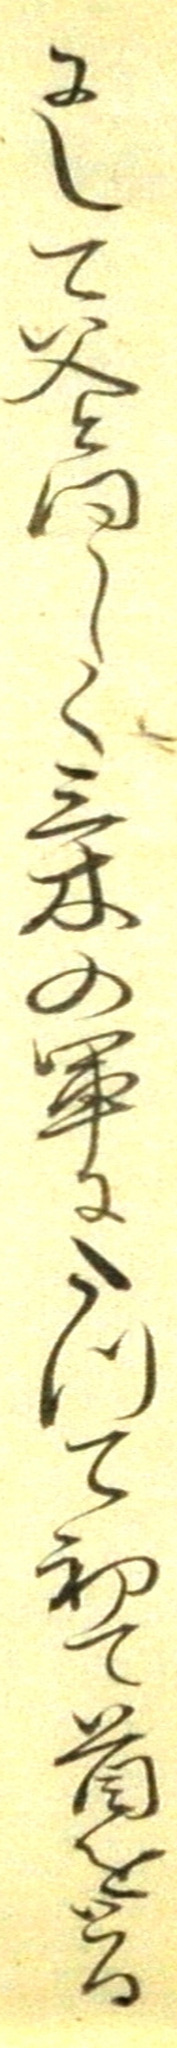にして父と同しく三木の軍にたつて初て首をとる
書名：藩翰譜（七・上）
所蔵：伊那市立高遠町図書館・合同会社AMANE
